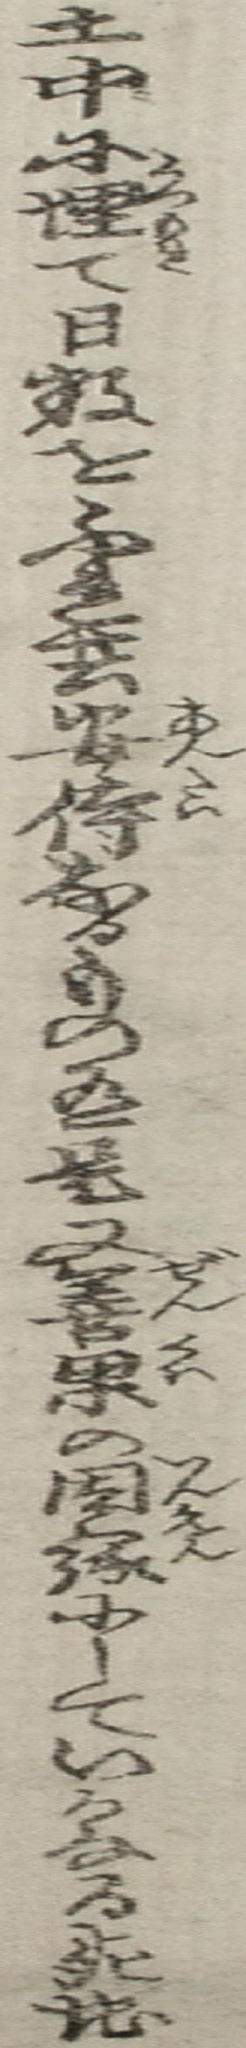土中に埋て日数をふれ共安体なるもの有是又善果の因縁にしていかなる死地
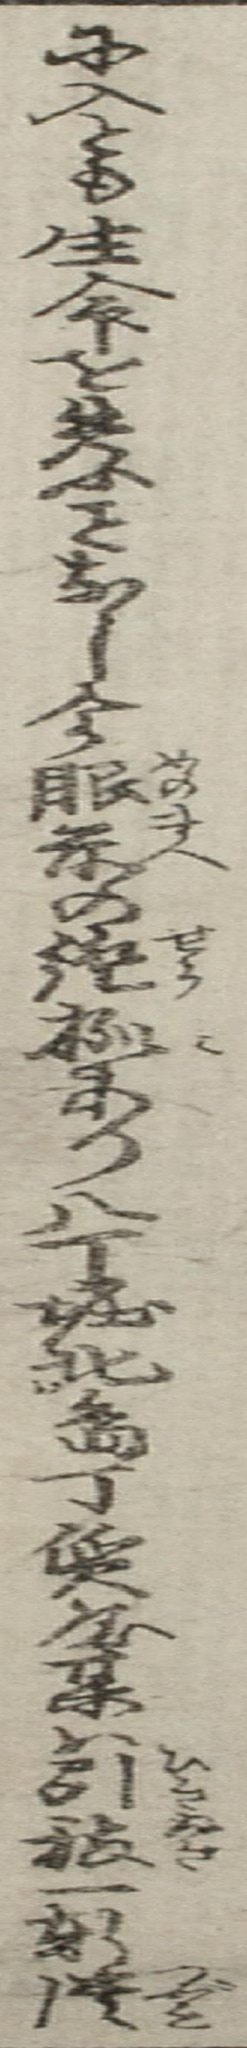に入とも生命を失ふことなし今眼前の証拠あり八丁堀北島丁質屋某は引抜一軒潰
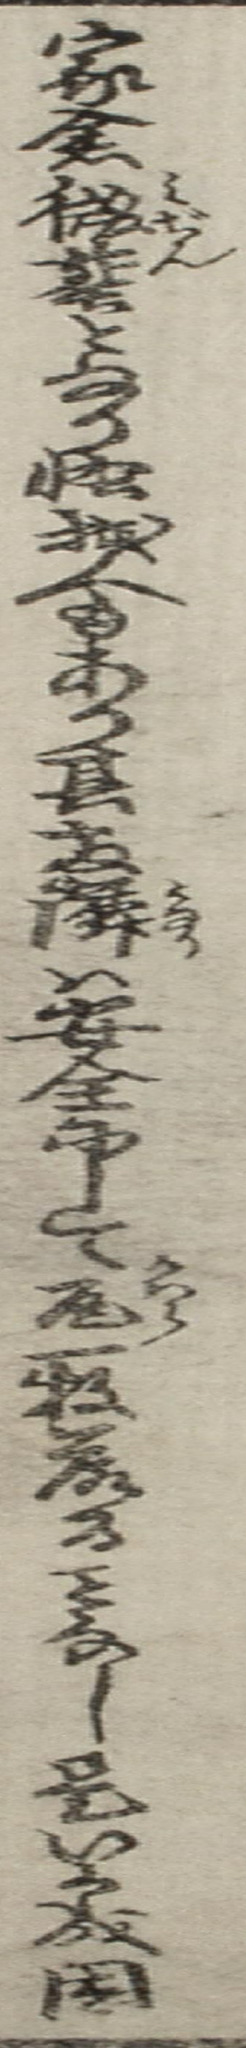家倉微塵となり怪我人もあり其両隣は安全にして瓦一枚落ることなし是いか成因
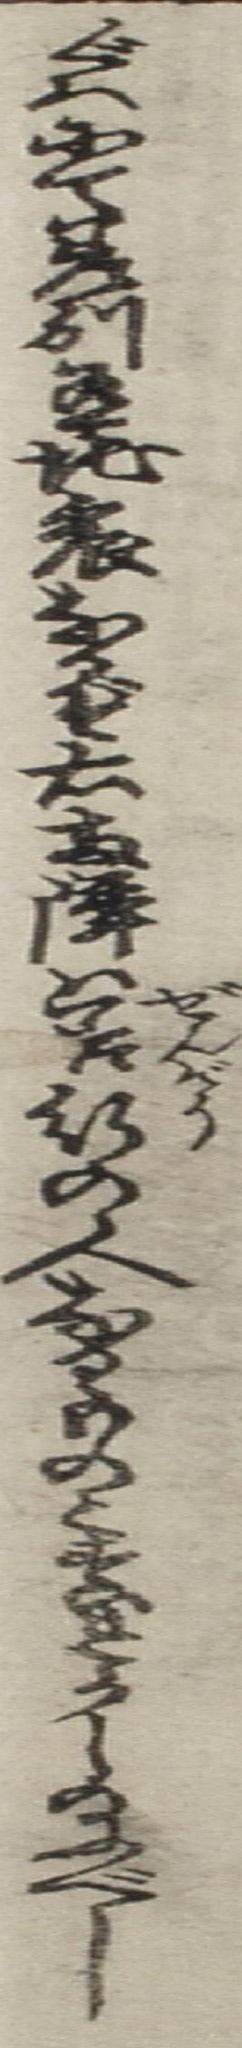ぐはにて差別有地震なるぞ右両隣は善行の人なるものとすいれうし給ふべし
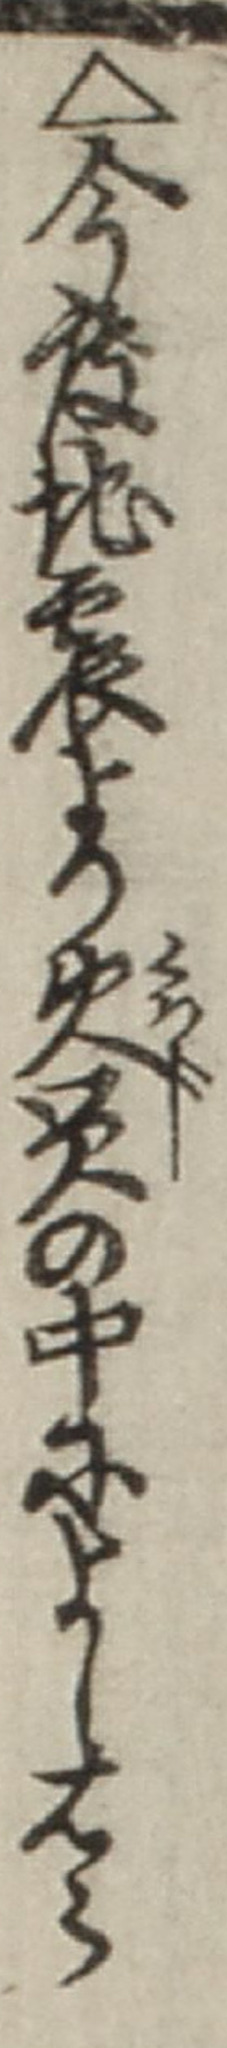△今度地震より火災の中によしはら
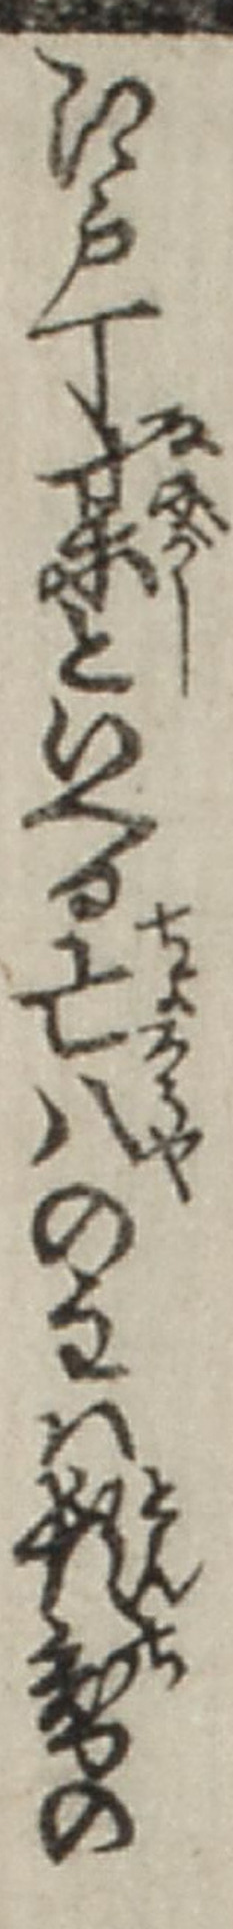江戸丁某といへる亡八の主は頓智の
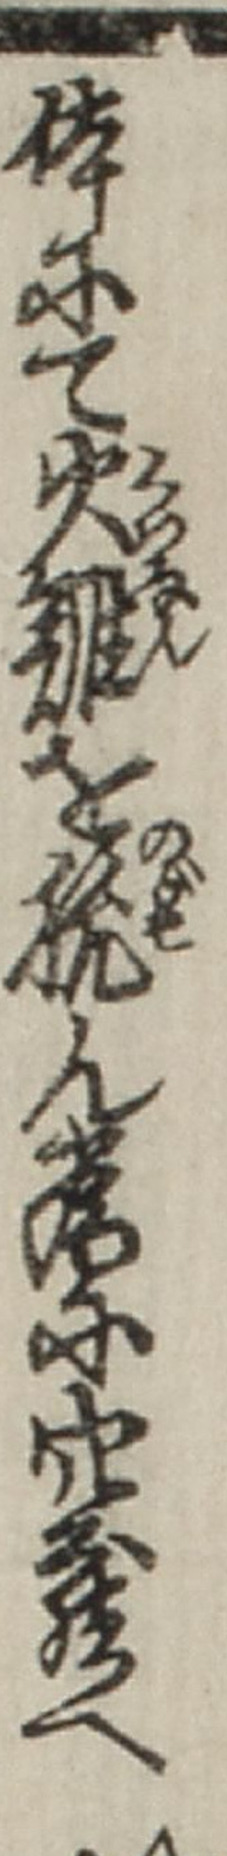体にて火難を脱ん為に穴蔵へ
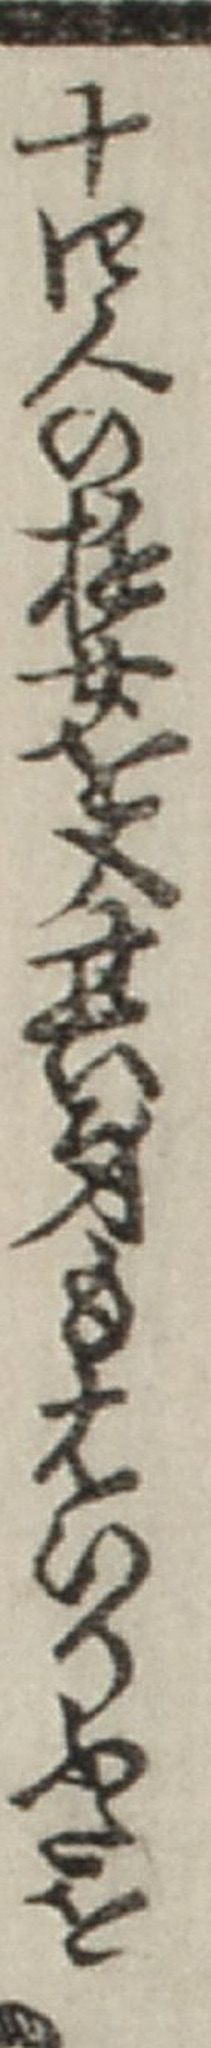十四人の遊女を入其身もはいりふたを
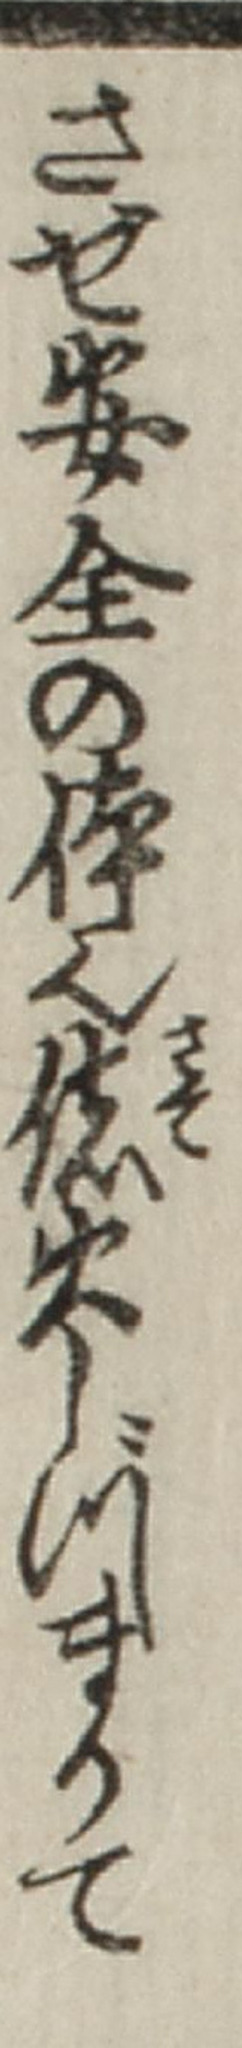させ安全の体也偖火しづまりて
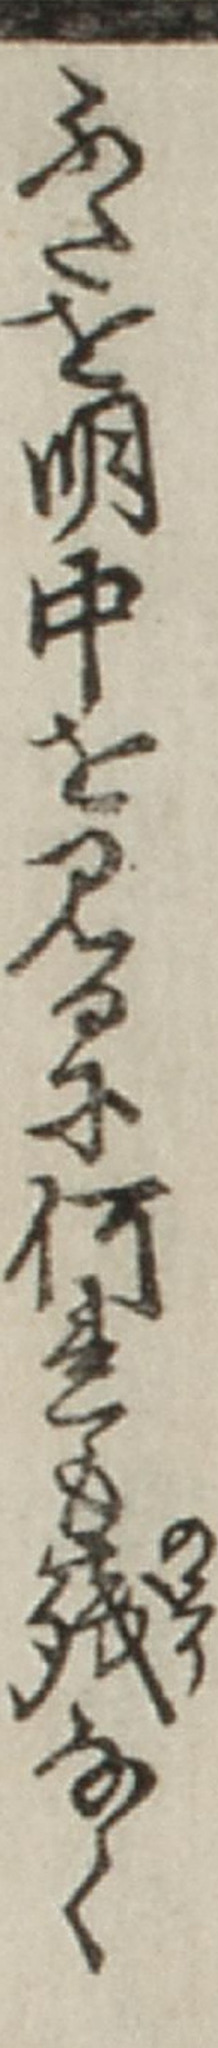ふたを明中を見るに何れも残なく
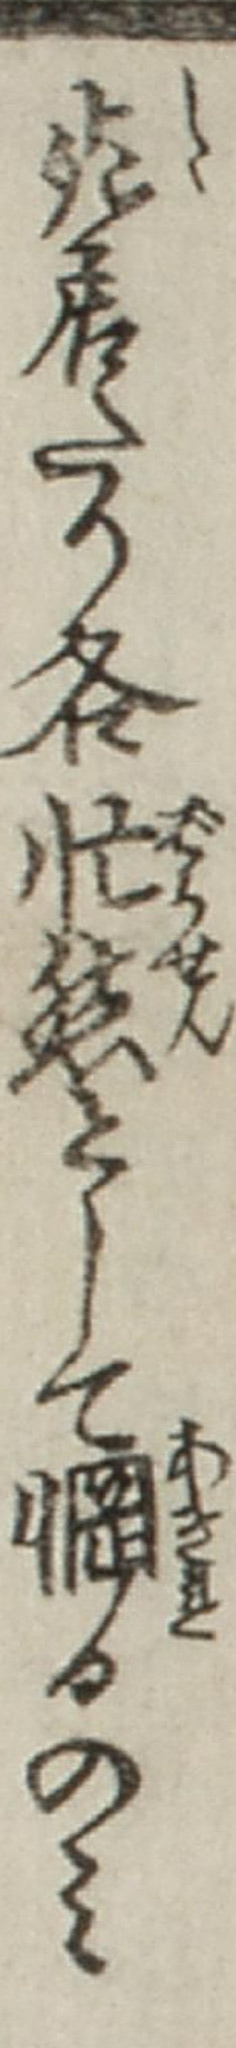死居たり各忙然として惘るのみ
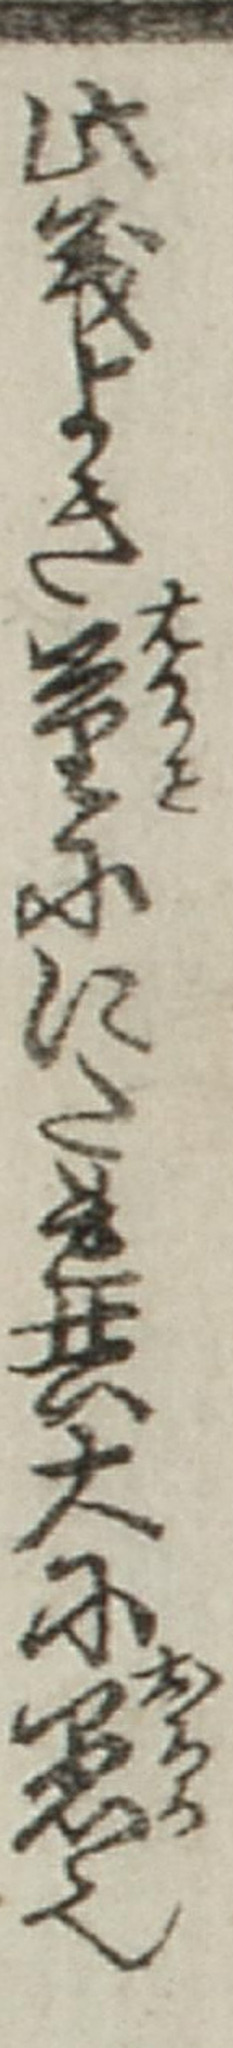此義よき量ににたれ共大に愚也
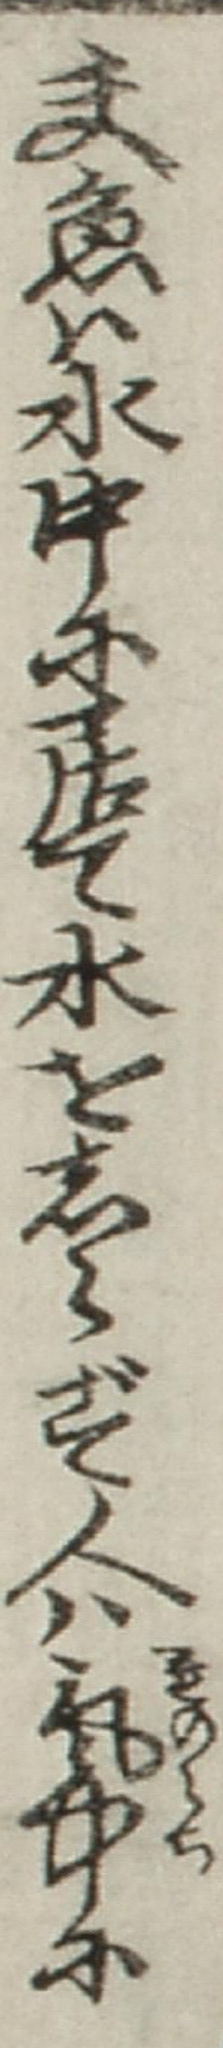夫魚は水中に居て水をしらず人は気中に
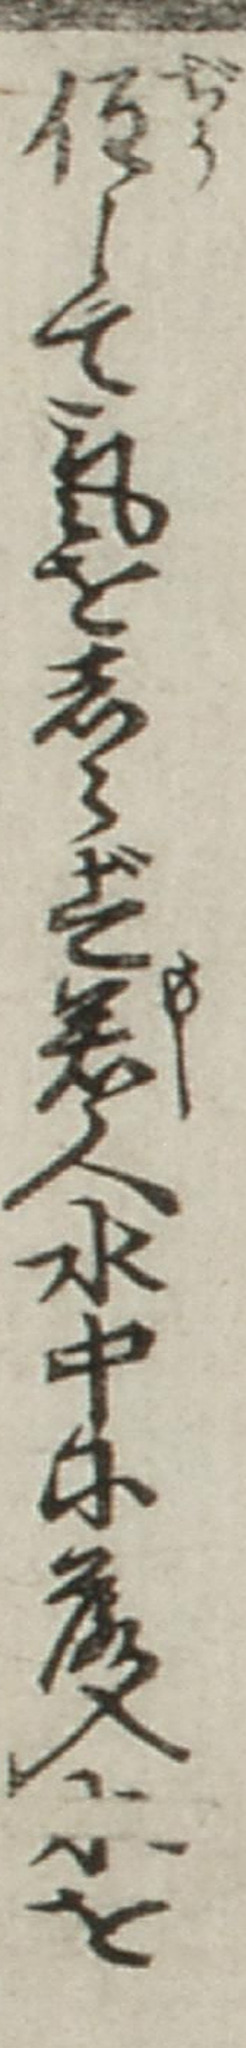住して気をしらず若人水中に落入水を
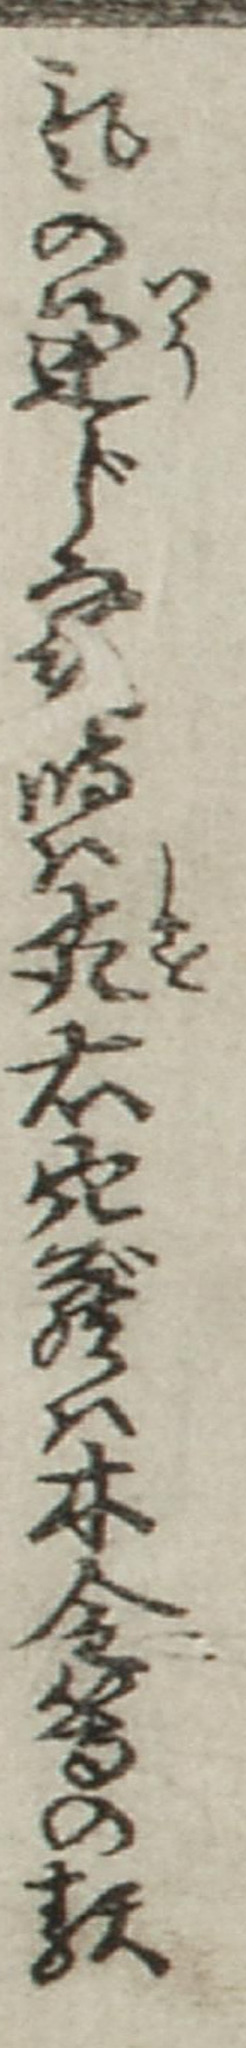気の通じなき時は死右穴蔵は木金等の類

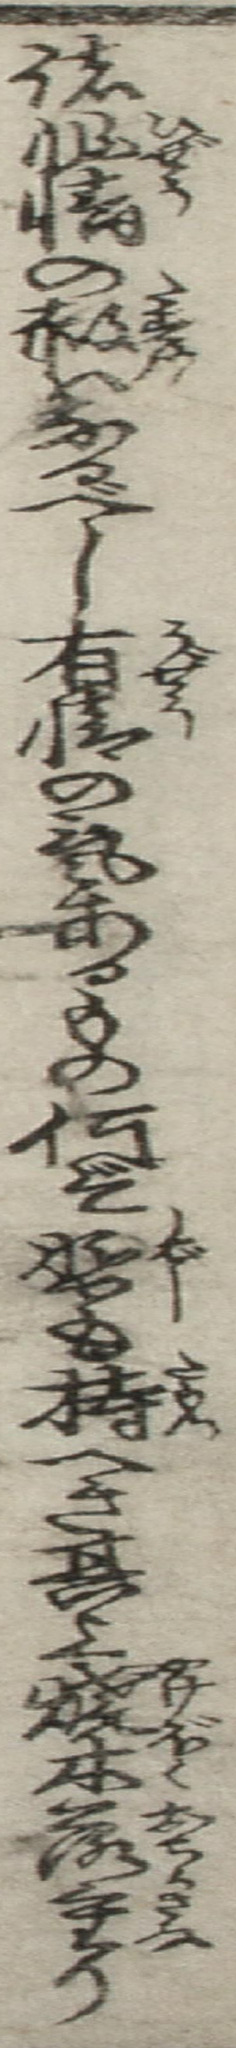諸非情の赦はなるべし有情の気あるもの何ぞ暫も持へき其上焼木落重り
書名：安政見聞誌　下
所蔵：東京大学地震研究所図書室 Earthquake Research Institute Library, The University of Tokyo, JAPAN
